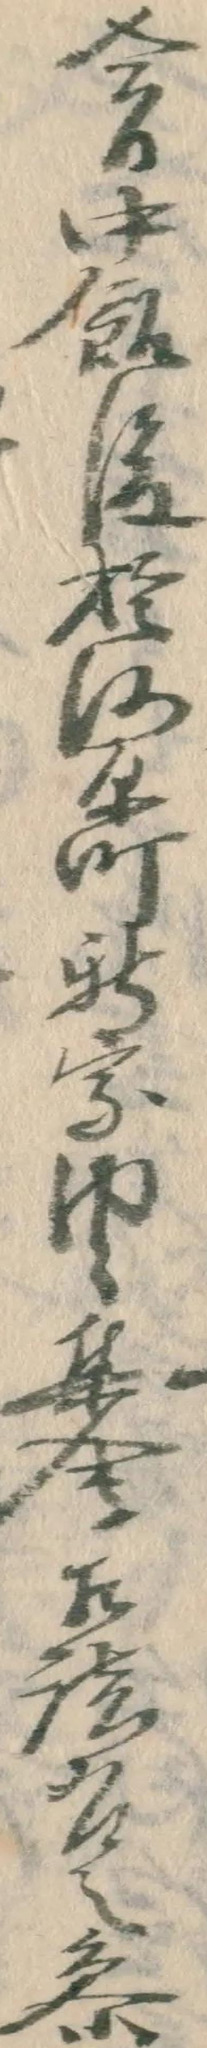今日中飯後於河原町新家内々集會相談有之参
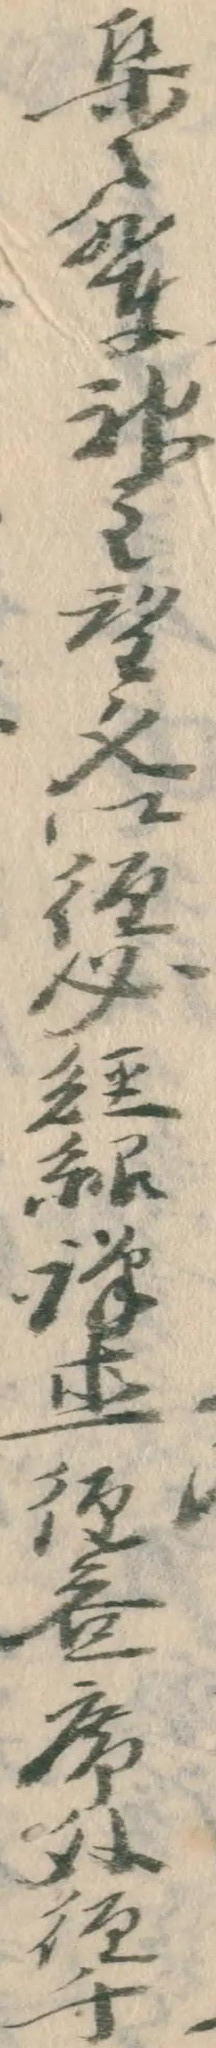集之輩神主望久江経必経招経直経益席外経千
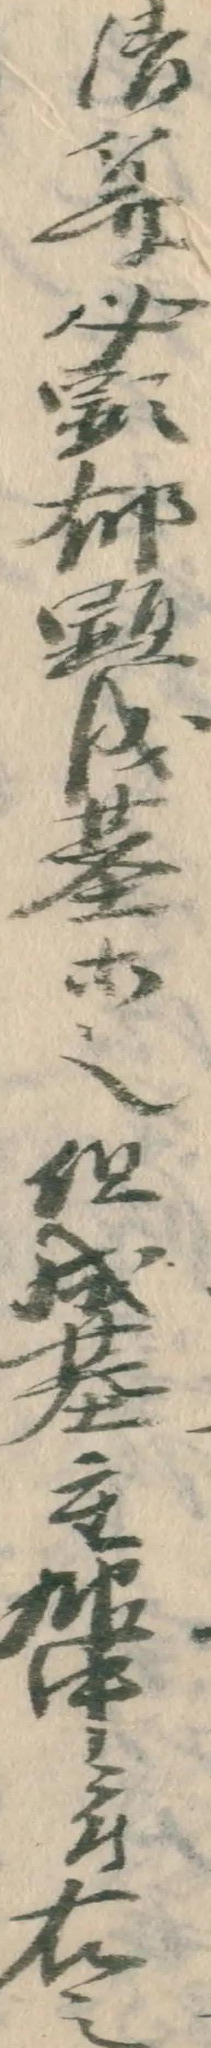清算必顕郁顕成茎等也但成基重服中に付右之
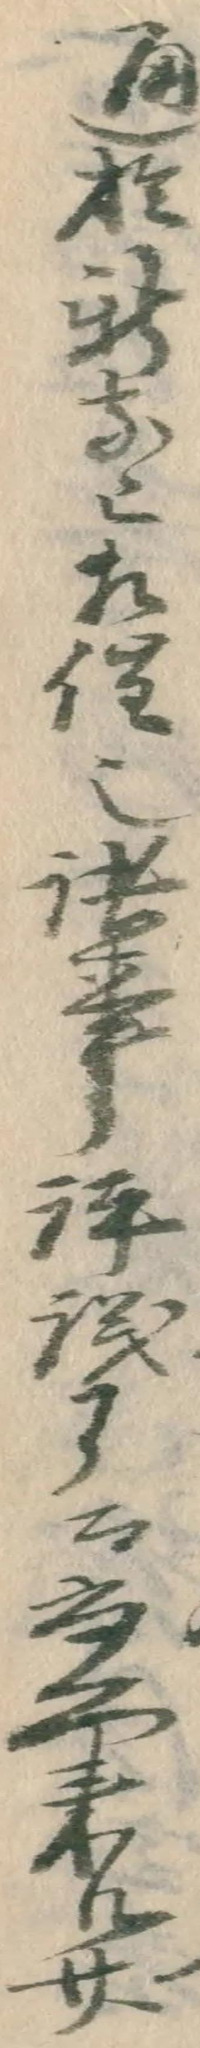通於新家被相催也諸事評議了而尚又来ル廿

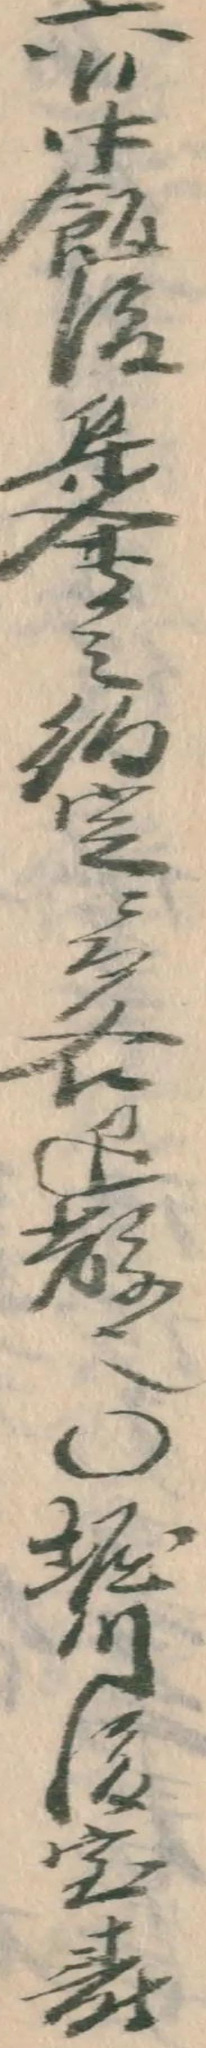六日中飯後集會之約定二而各退散也〇堀川後室壽
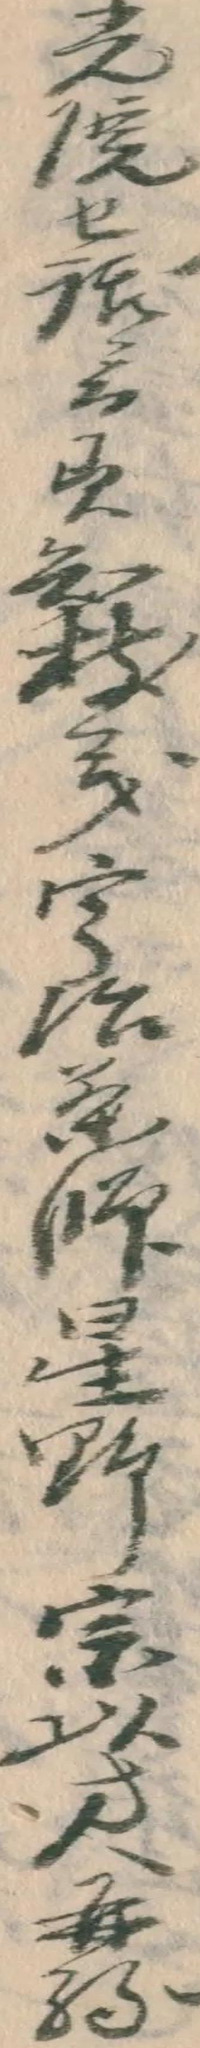光院世話ニ而美知枝義定治茶師星野宗以方ヘ再嫁
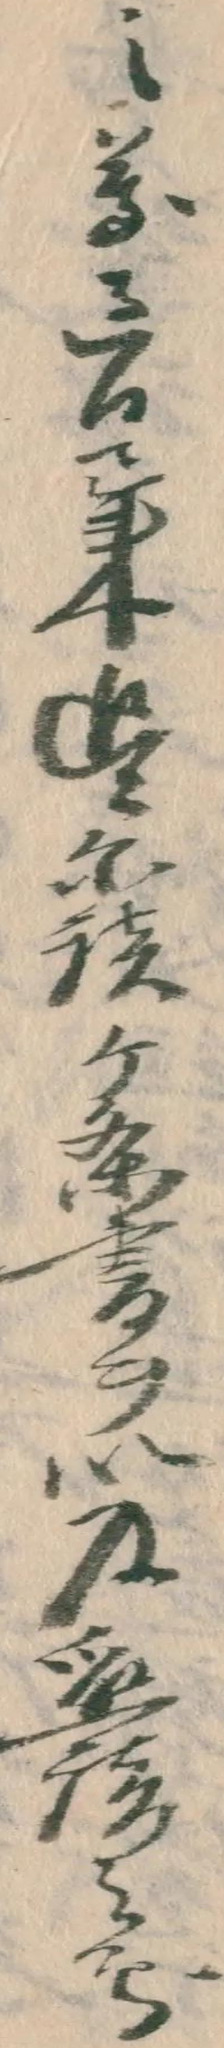之義過日已来追々尓談ケ条書ヲ以及懇請之處
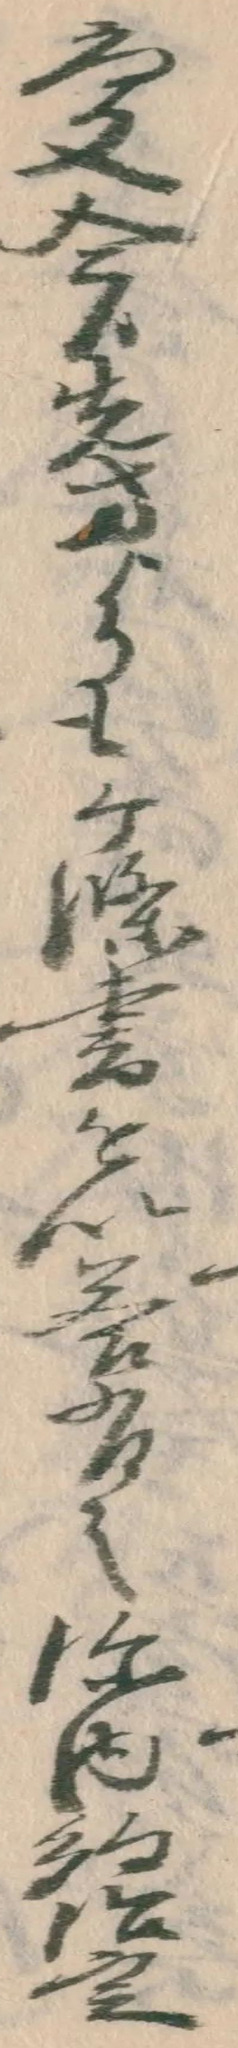尚又今日先方よりもケ條書を以答有之弥内約治定
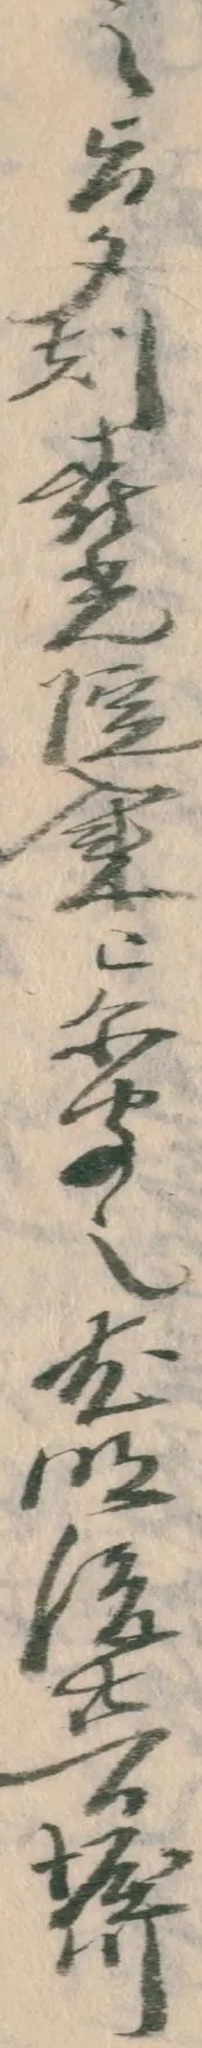之旨夕刻森光院入来被示聞也尤明後廿一日堀川
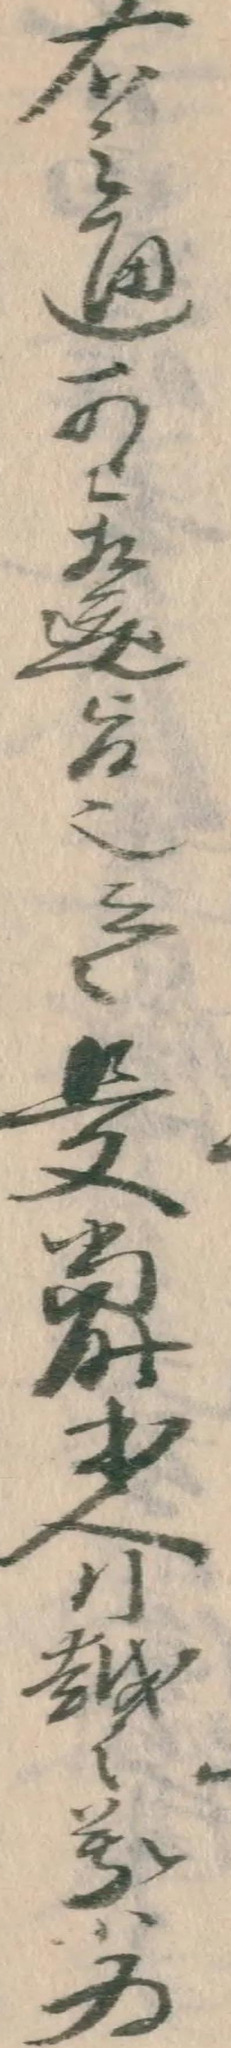右之通可被相送旨也云々且又當時弐人引越之義ハ為
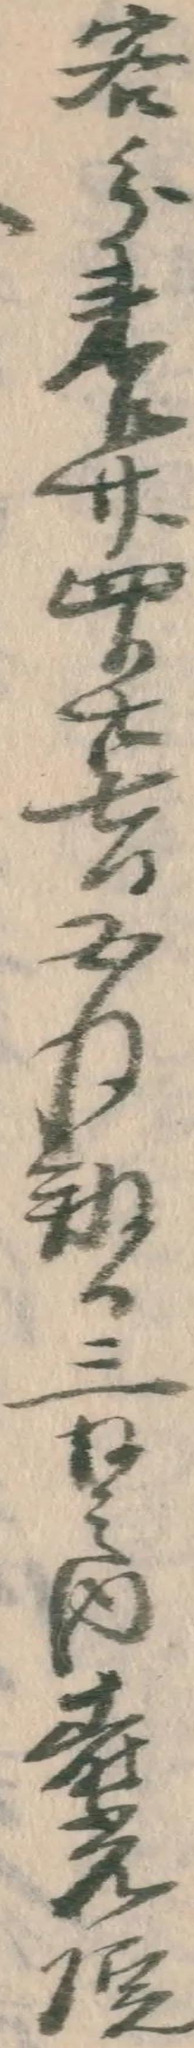客分来ル廿四日廿七日五月朔日三日之内壽光院
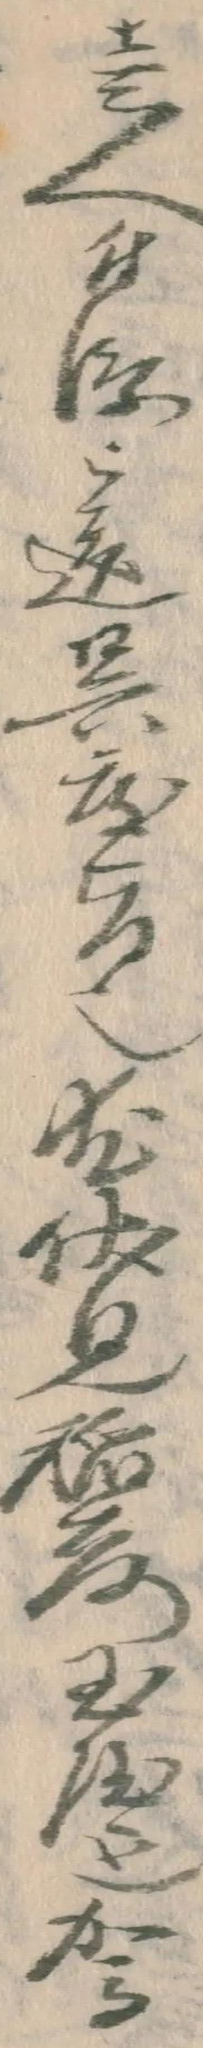壱人付添被送呉度旨也然伏見稲荷玉屋迄駕
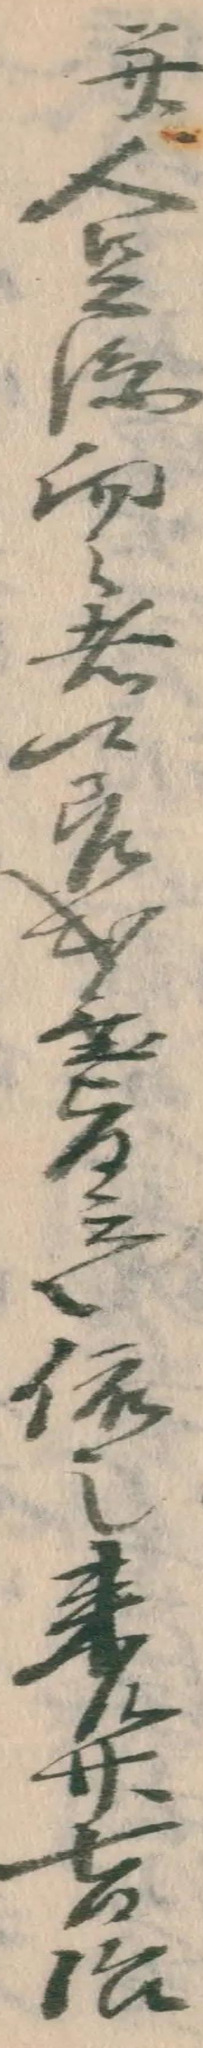并人足添向之者可差出旨云々依之来ル廿七日治
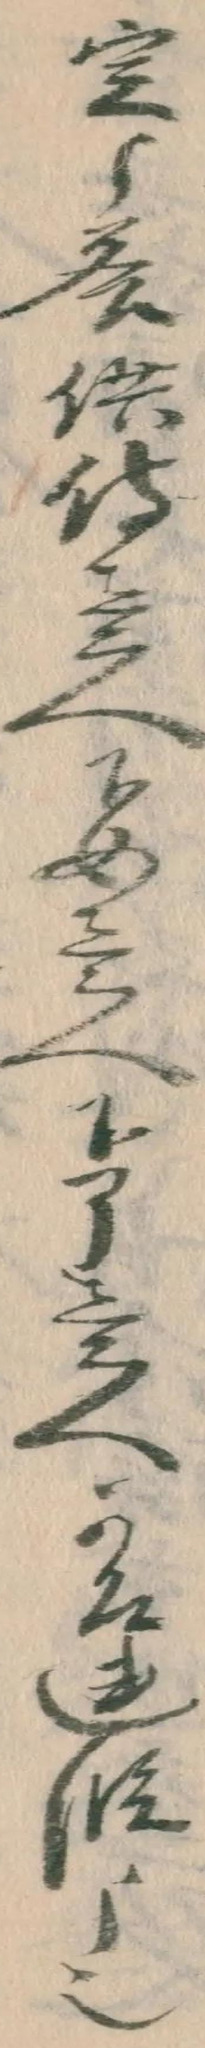定申答供侍壱人下女壱人下部壱人可召連段申也
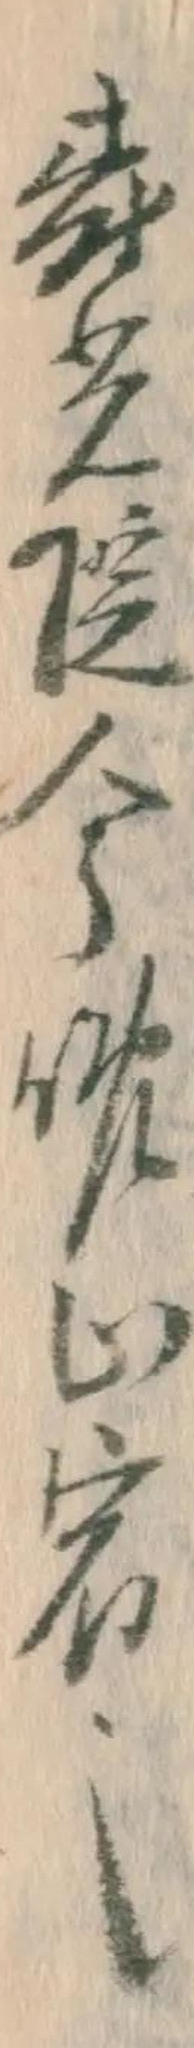壽光院今晩止宿也
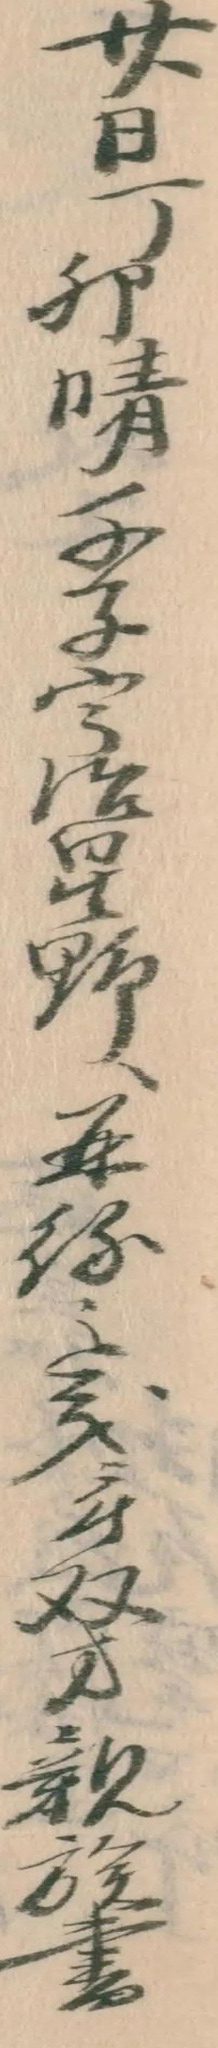廿日丁卯晴千子宇治星野へ再縁之義ニ付双方親族書
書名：賀茂社記録. 第67冊
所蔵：国立国会図書館 National Diet Library, JAPAN
